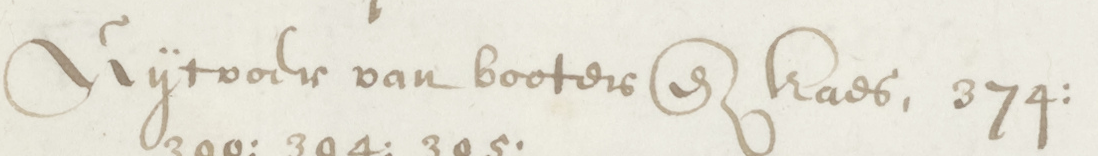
Uijtvoer van booter en kaes, 374:
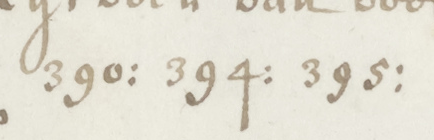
390: 394: 395:
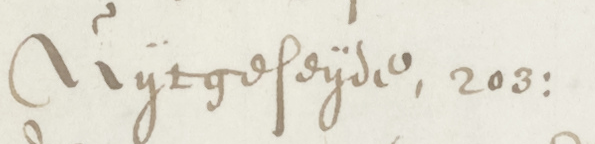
Uijtgeseijde, 203:
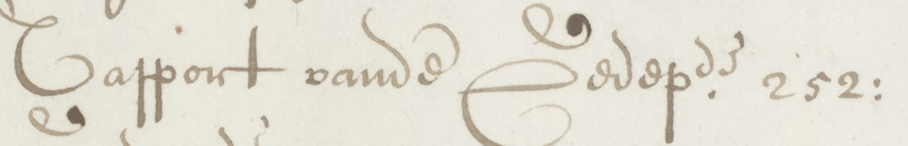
Rapport vande Gedepde. 252:
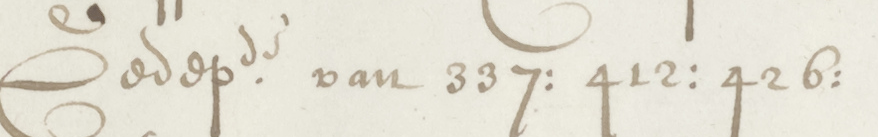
Gedepde. van 337: 412: 426:
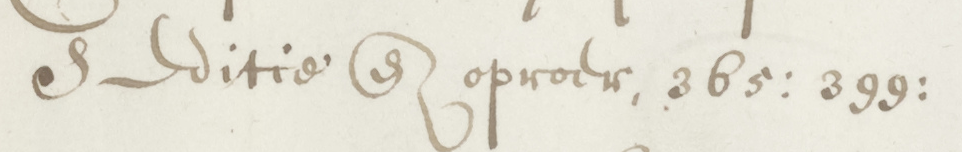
Seditie en oproer, 365: 399:
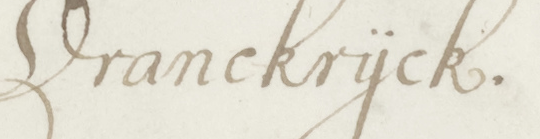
Vranckrijck.
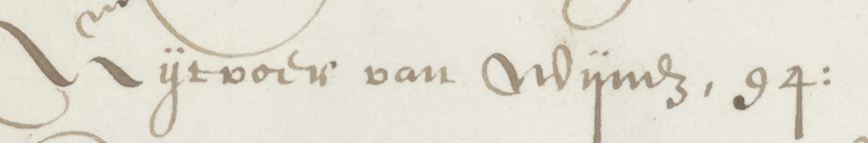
Uijtvoer van Wijnen, 94:
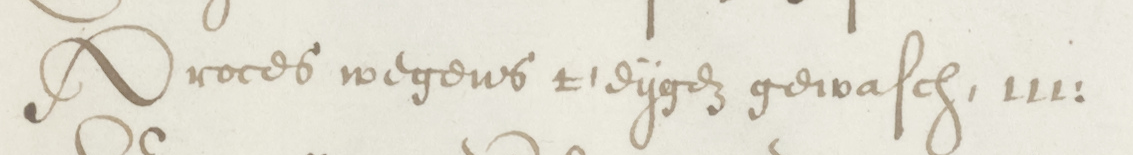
Proces wegens t' eijgen gewasch, 111:
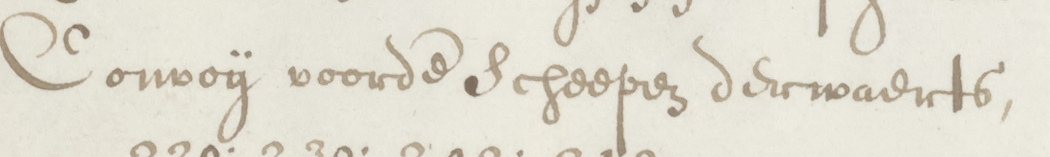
Convoij voorde Scheepen derwaerts,
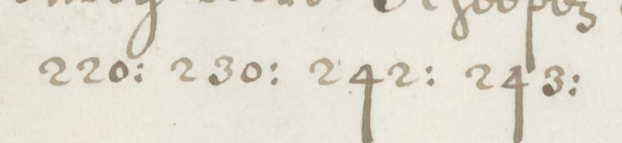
220: 230: 242: 243:
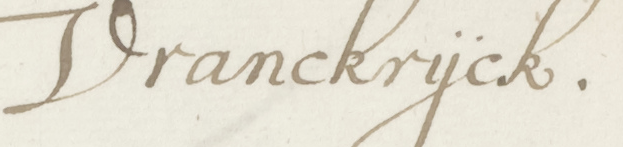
Vranckrijck.
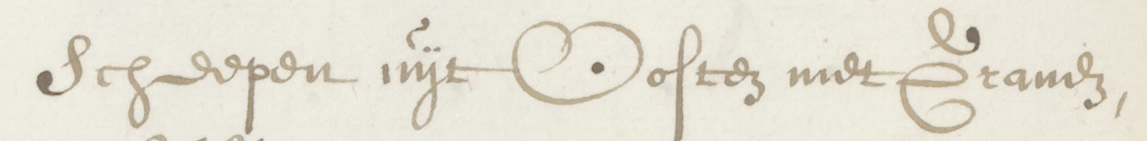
Scheepen uijt Oosten met Granen,
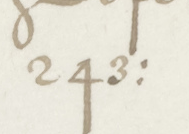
243:
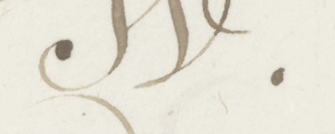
W.
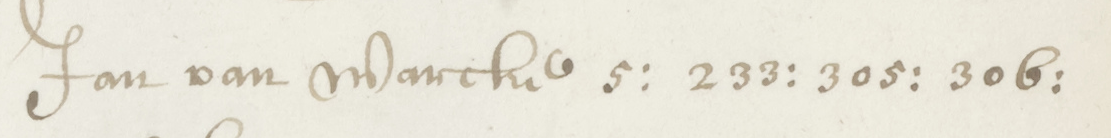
Jan van Warcke 5: 233: 305: 306:
